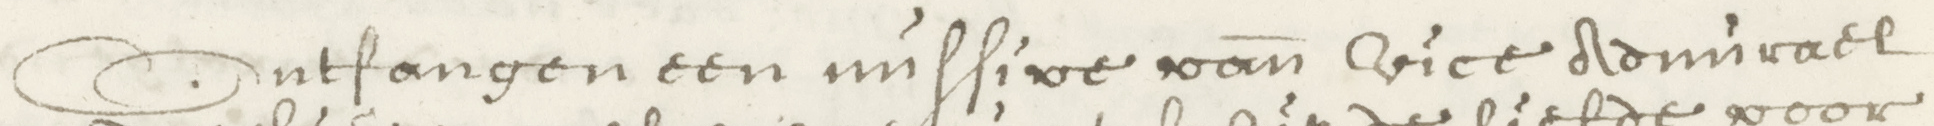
Ontfangen een missive van Vice Admirael
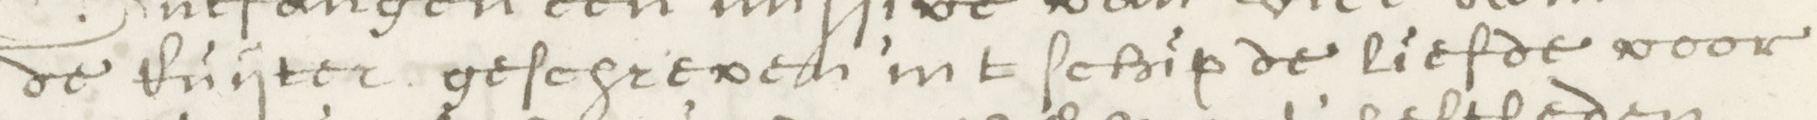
de Ruijter, geschreven int schip de liefde voor
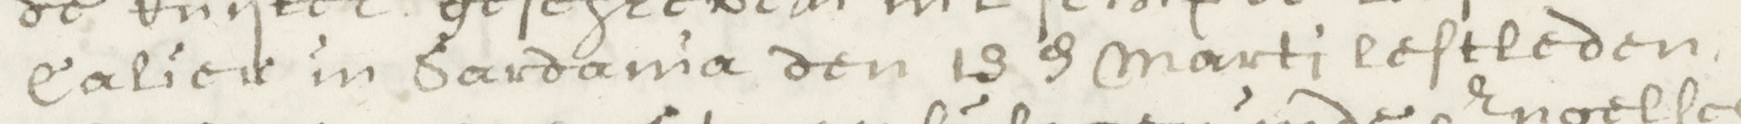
Calier in Sardania den 13en marti lestleden,
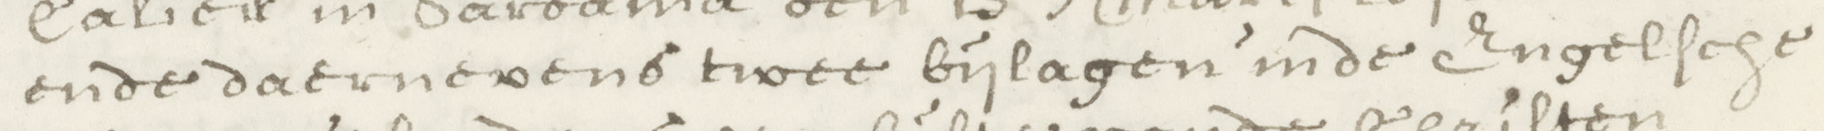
ende daernevens twee bijlagen in de Engelsche
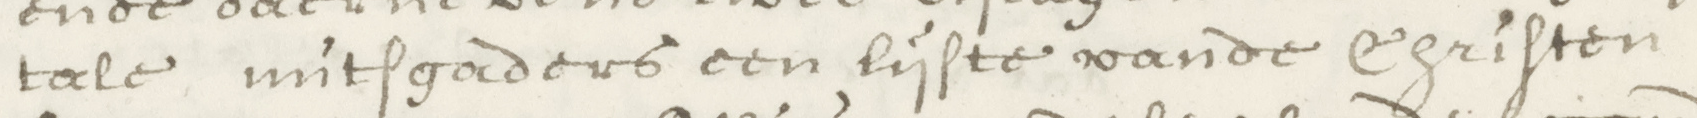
tale mitsgaders een lijste vande Christen
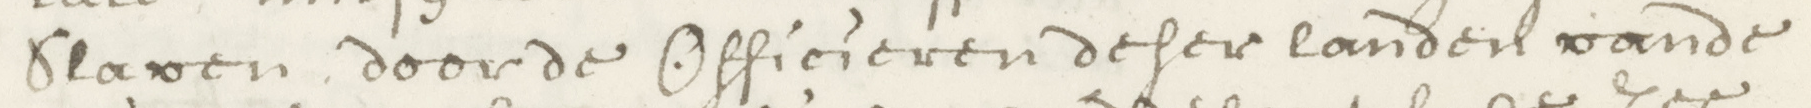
Slaven, door de Officieren deser landen vande
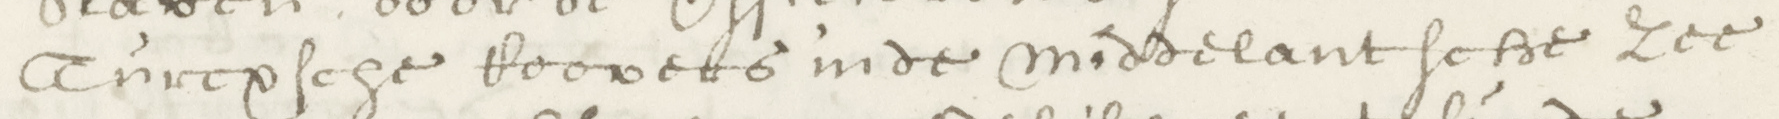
Turcxsche Roovers inde middelantsche Zee
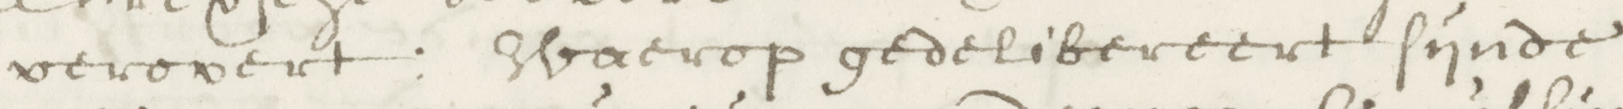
verovert: Waerop gedelibereert sijnde
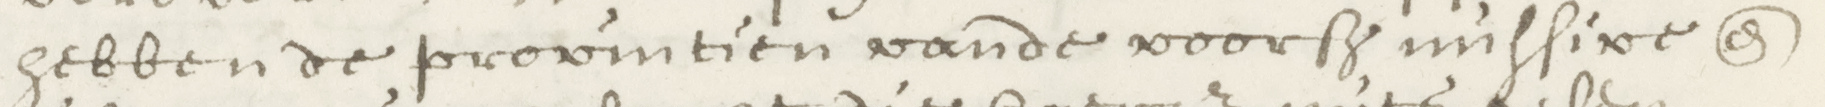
hebben de provintien vande voors missive &
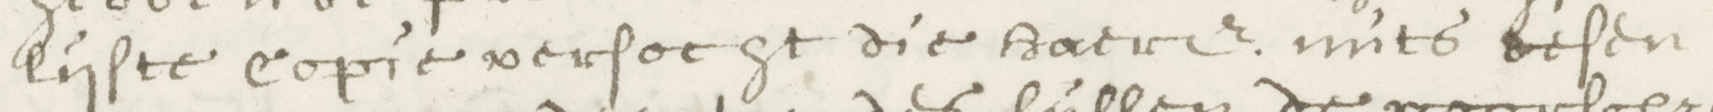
lijste copie versocht die haer E. mits desen
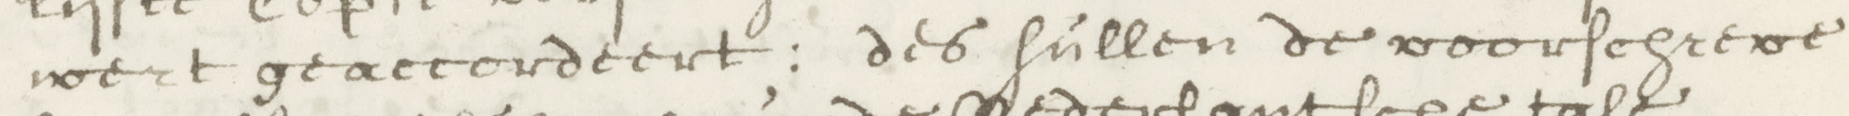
wert geaccordeert: des sullen de voorschreve
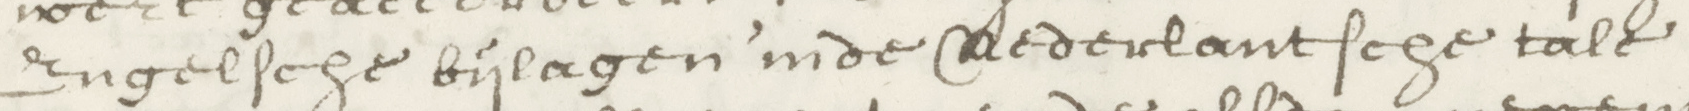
Engelsche bijlagen inde Nederlantsche tale
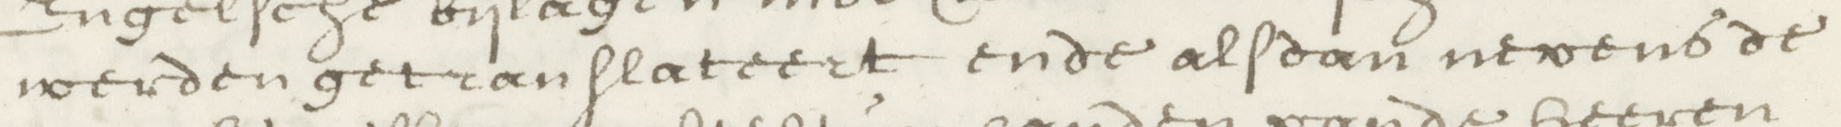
werden getranslateert ende alsdan nevens de
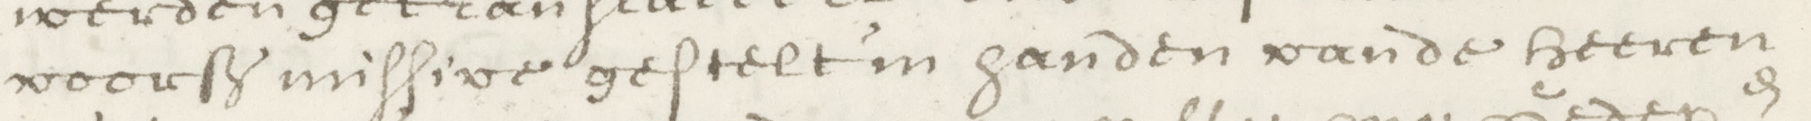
voors missive gestelt in handen van de heeren
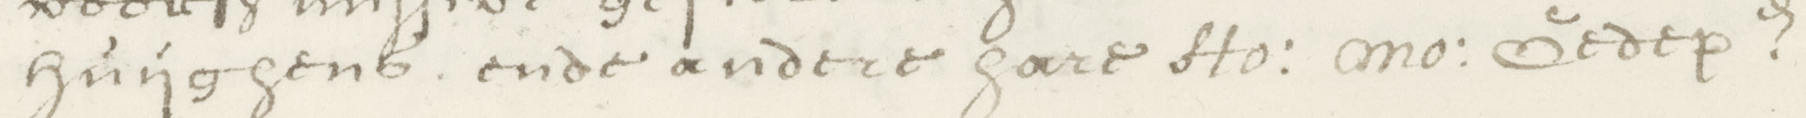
Huijghens, ende andere hare Ho:Mo: Gedepen.
